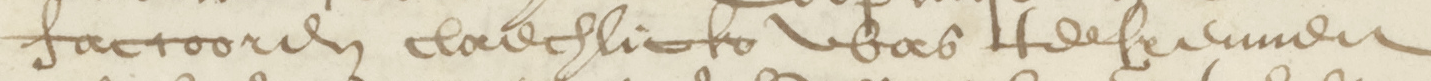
factooren claechlick was te kennen
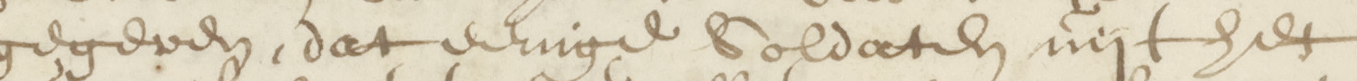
gegeven, dat eenige Soldaten uijt het
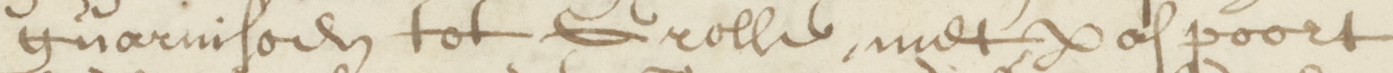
guarnisoen tot Grolle, met paspoort
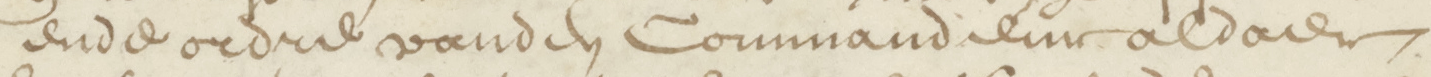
ende ordre vanden Commandeur aldaer,
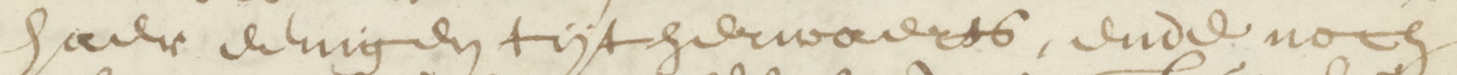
haer eenigen tijt herwaerts, ende noch
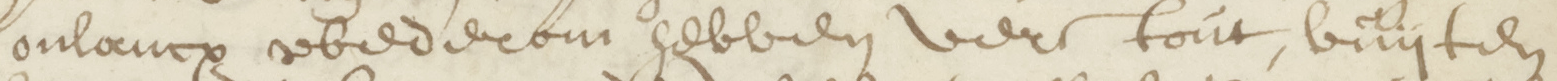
onlancx wederom hebben verstout, buijten
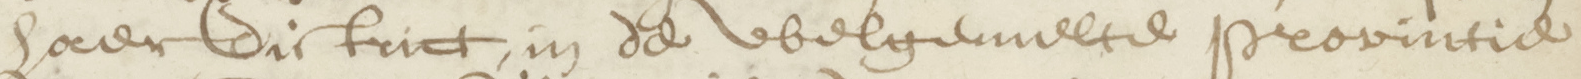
haer District, in de welgemelte Provintie
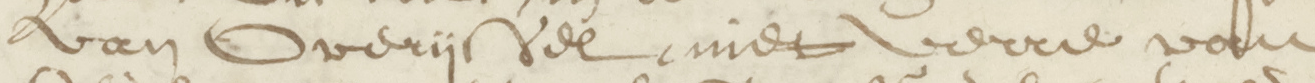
van Overijssel, niet verre van
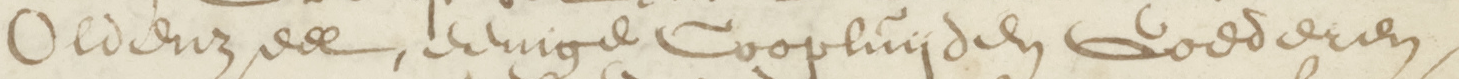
Oldenzeel, eenige Coopluijden Goederen,
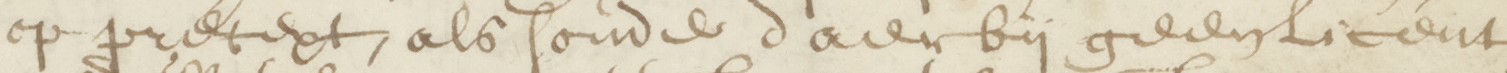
op pretext, als soude daerbij geen licent
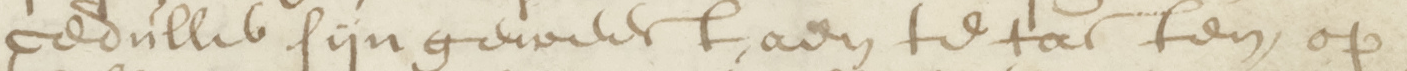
cedulle sijn geweest, aen te tasten, op
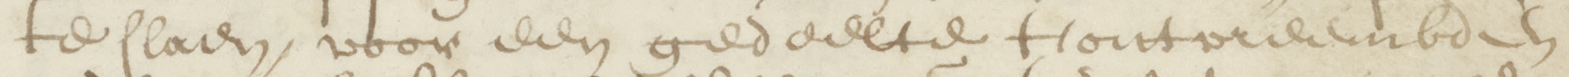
te slaen, voor een gedeelte t'ontvreembden
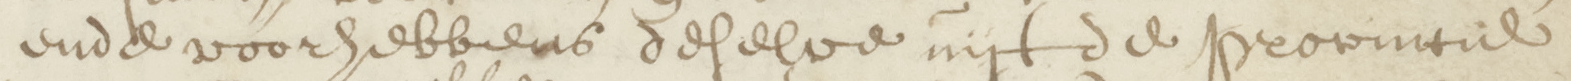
ende voorhebbens deselve uijt de provintie
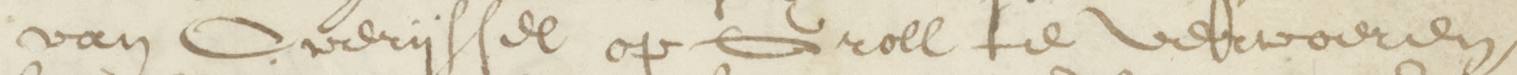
van Overijssel op Groll te verrvoeren,
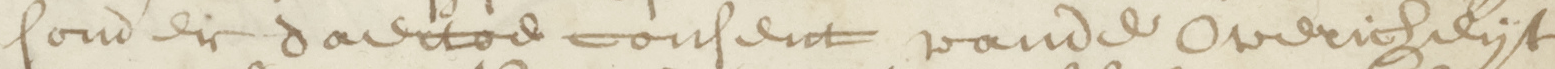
sonder daertoe consent vande Overicheijt
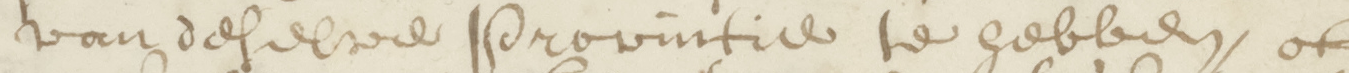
van deselve Provintie te hebben, ofte
